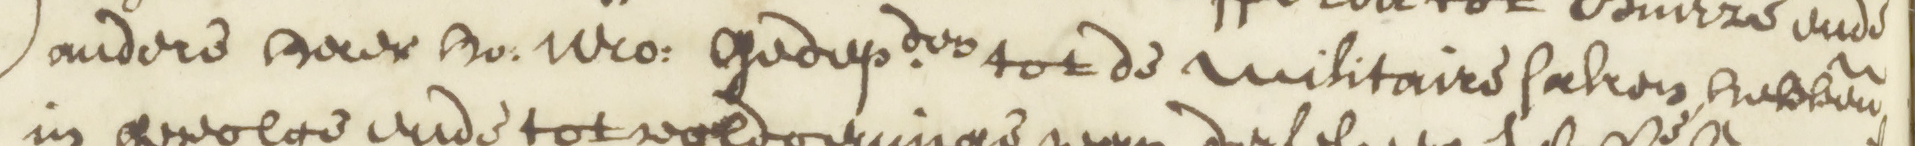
andere haer Ho:Mo: Gedepden. tot de Militaire saken hebben
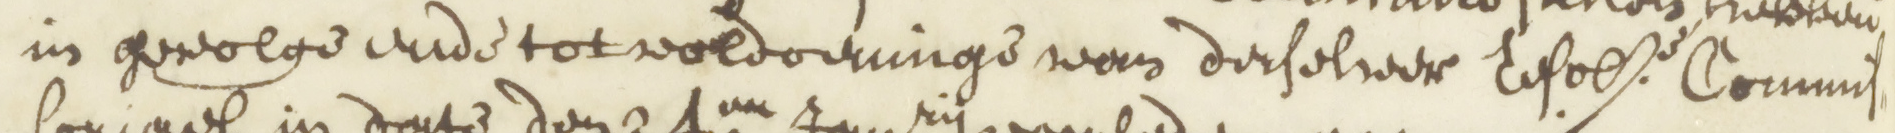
in gevolge ende tot voldoeninge van derselver Resole. Commis„
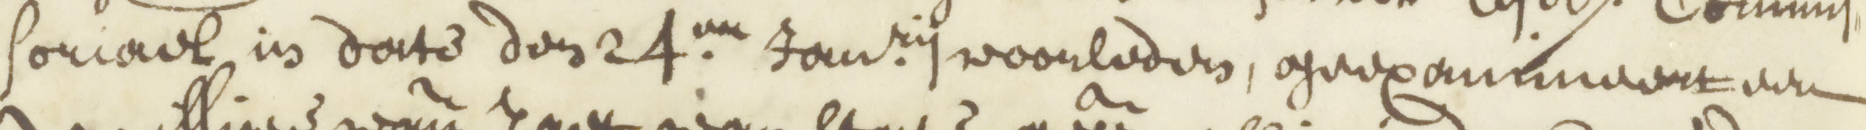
soriael in date den 24en. Janrij. voorleden, geexamineert een
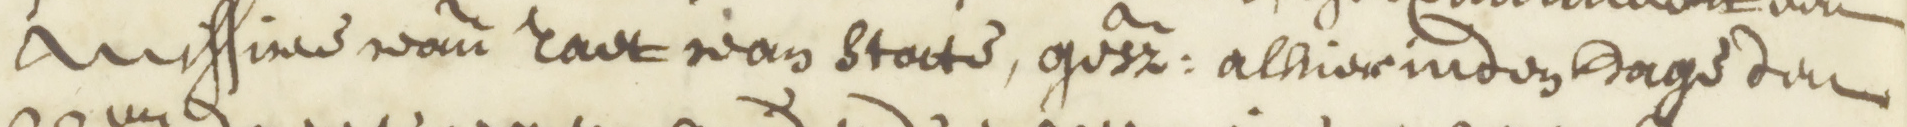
Missive van Raet van State, gesr: alhier inden Hage den
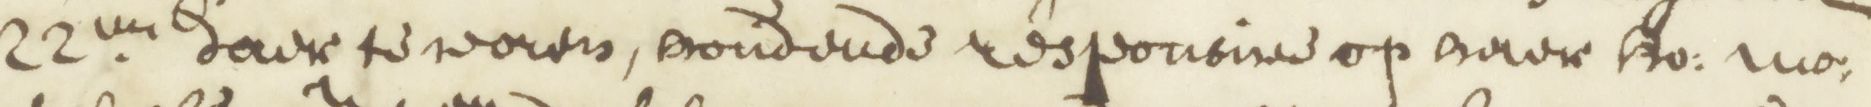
22en. daer te voren, houdende responsive op haer Ho:Mo:
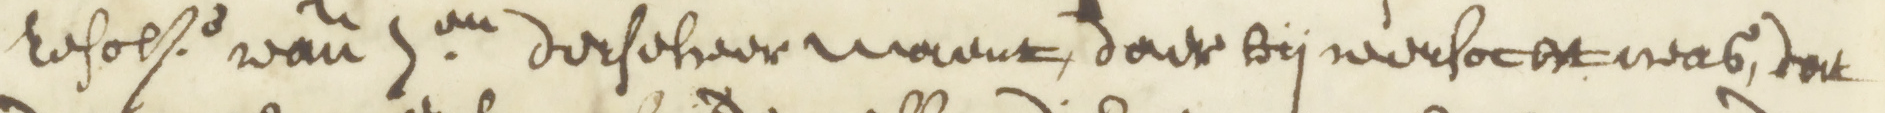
Resole. van 7en. derselver maent, daer bij versocht was, dat
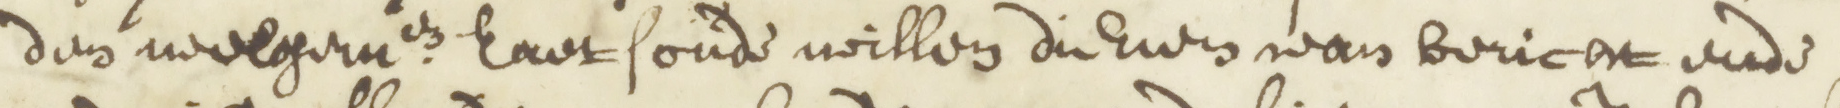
den welgemen. Raet soude willen dienen van bericht ende
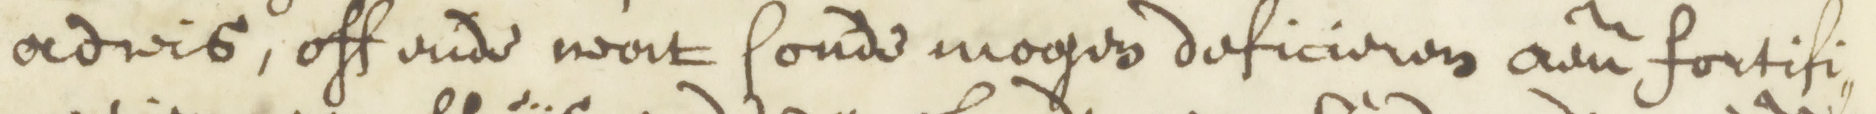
advis, off ende wat soude mogen deficieren aen fortifi„
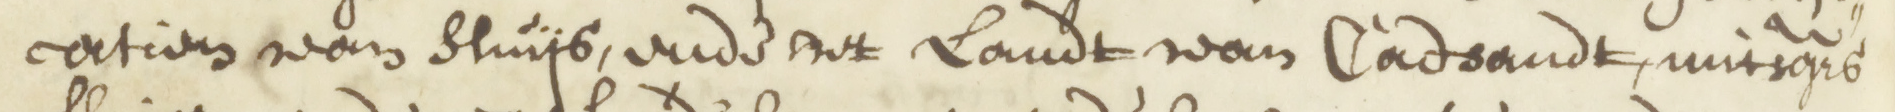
catien van Sluijs, ende het Landt van Cadsandt, mitsgrs
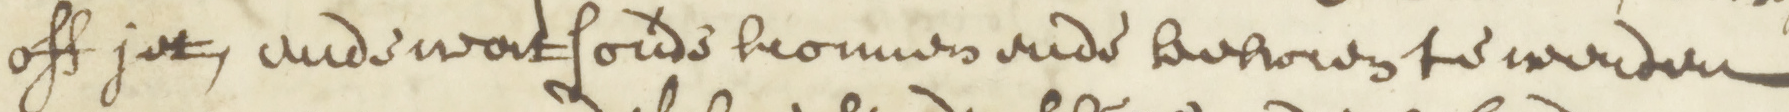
off iet, ende wat soude konnen ende behoren te werden
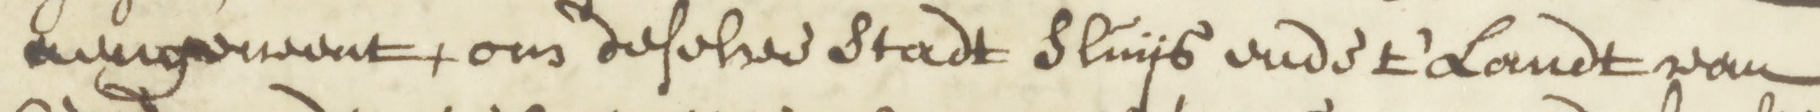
aengewent, om deselve Stadt Sluijs ende t' Landt van
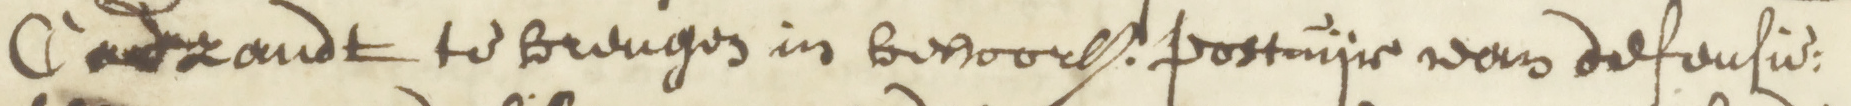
Cadzandt te brengen in behoorl. postuijr van defensie:
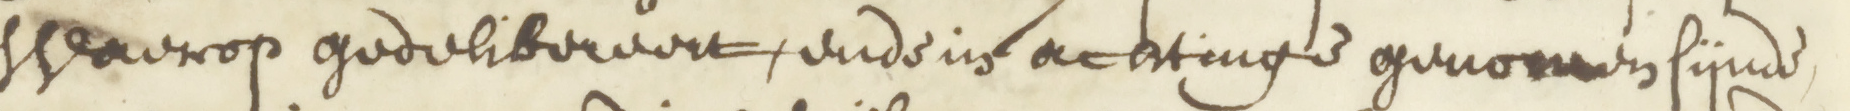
Waerop gedelibereert, ende in achtinge genomen sijnde,
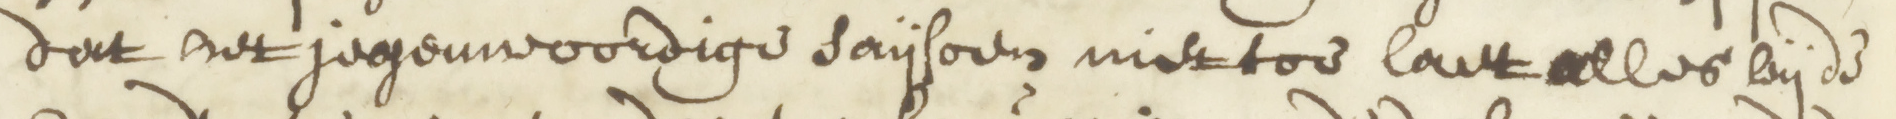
dat het jegenwoordige Saijsoen niet toe laet alles bij de
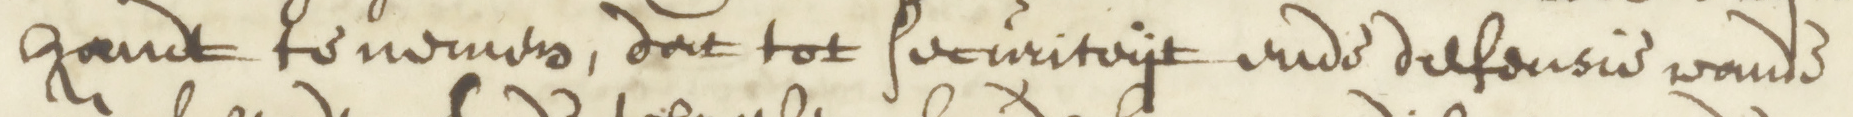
handt te nemen, dat tot securiteijt ende defensie vande
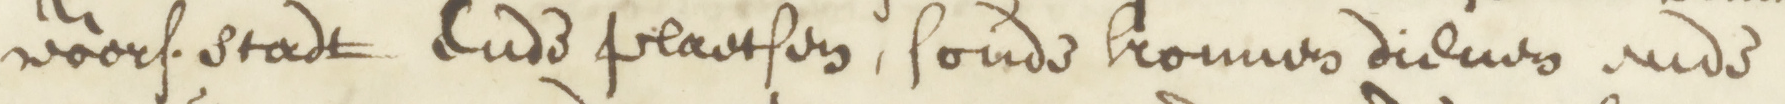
voors. stadt ende plaetsen, soude konnen dienen ende
